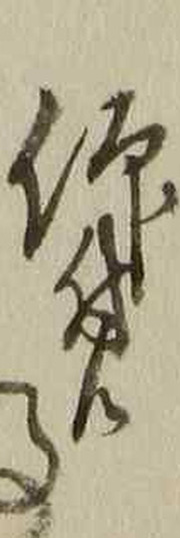仰付候
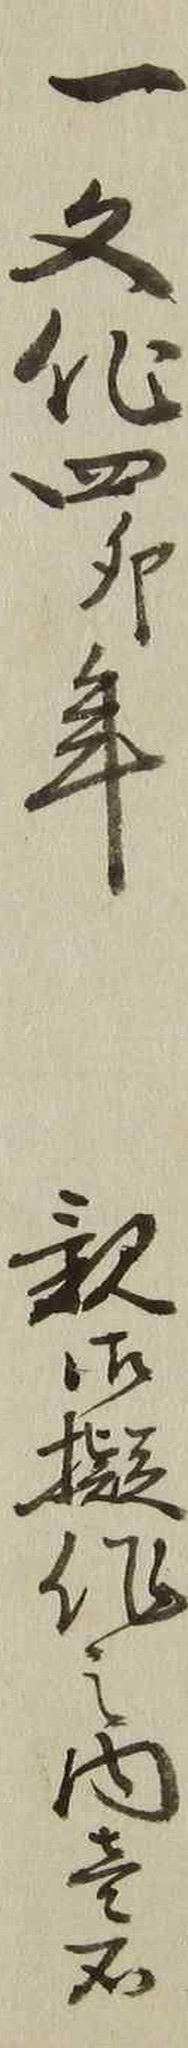一文化四卯年親御擬作之内壱石
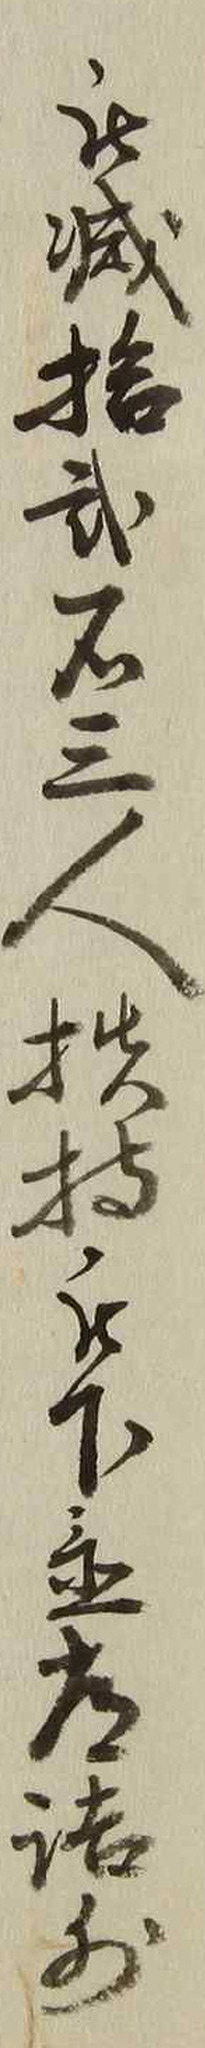被減拾弐石三人扶持被下置常詰外
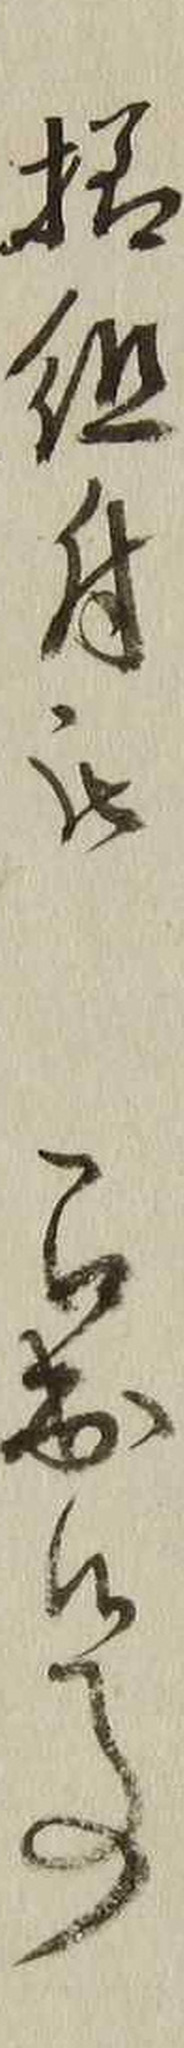様組付被召出候事
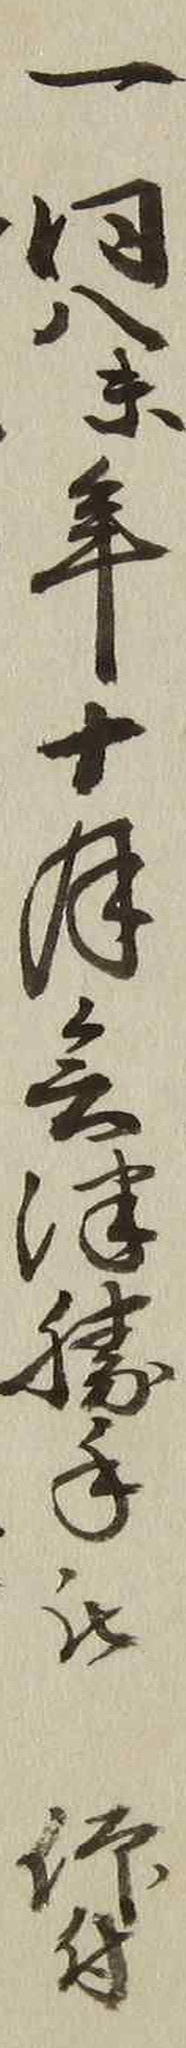一同八未年十月会津勝手被仰付
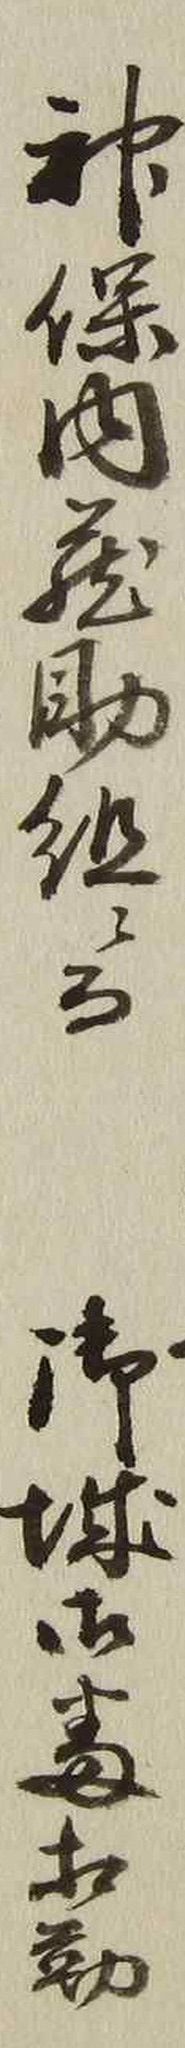神保内蔵助組ニ而御城御番相勤
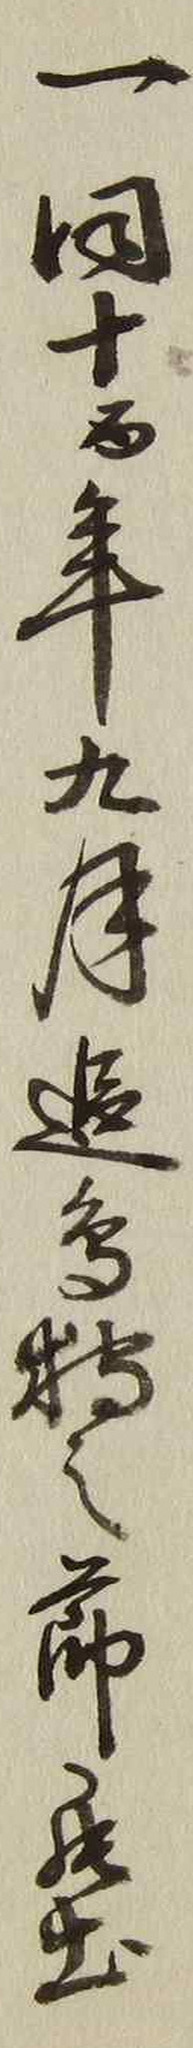一同十酉年九月追鳥狩之節罷出
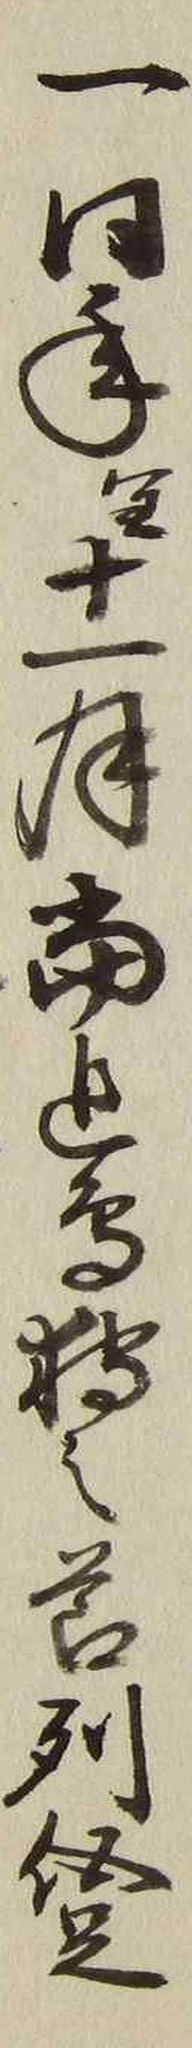一同年閏十一月当追鳥狩之節列伍足
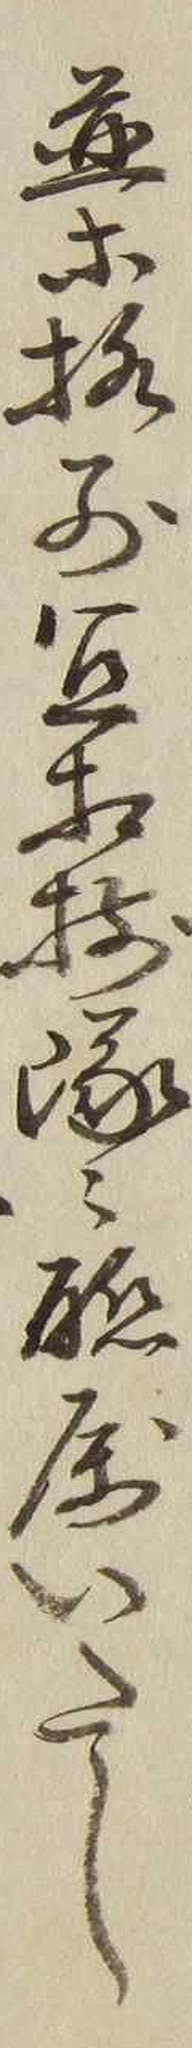並等格別宜相揃隊々聯属いたし
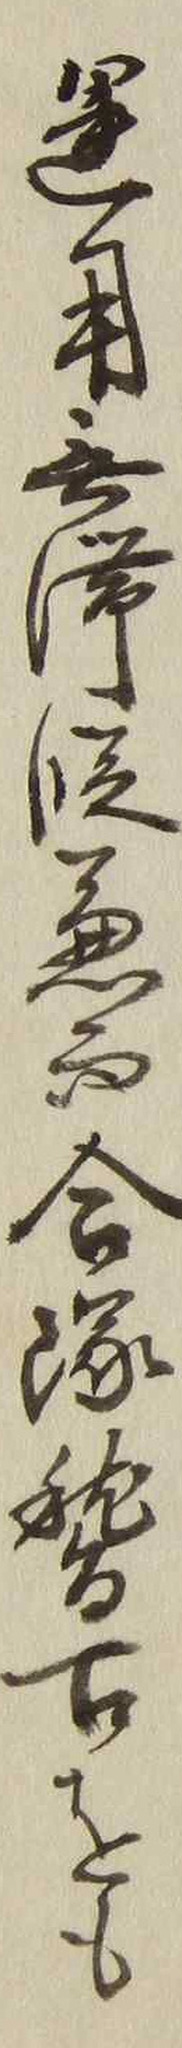運用無滞段兼而合隊稽古をも

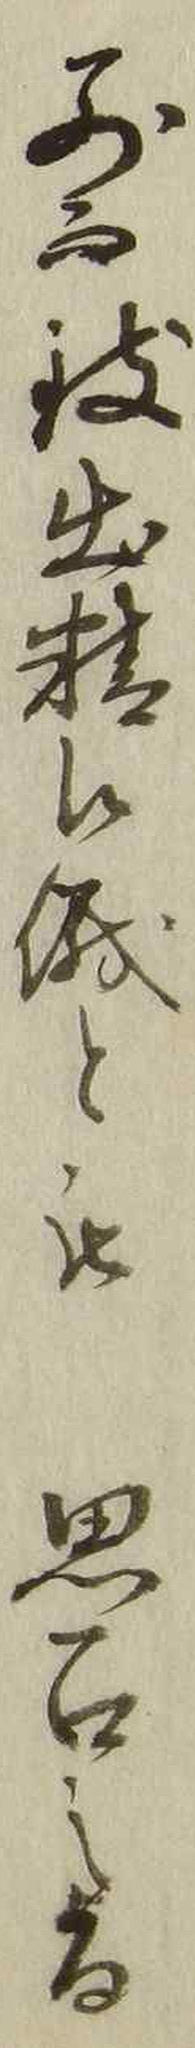別而致出精候儀と被思召之旨
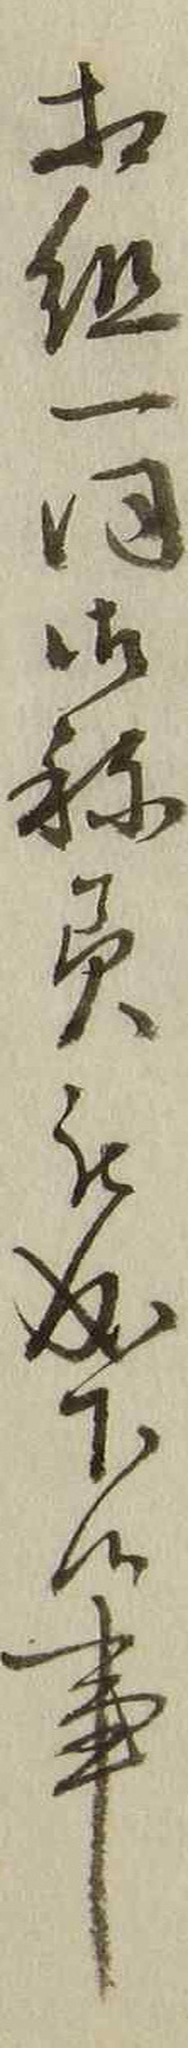相組一同称美被成下候事
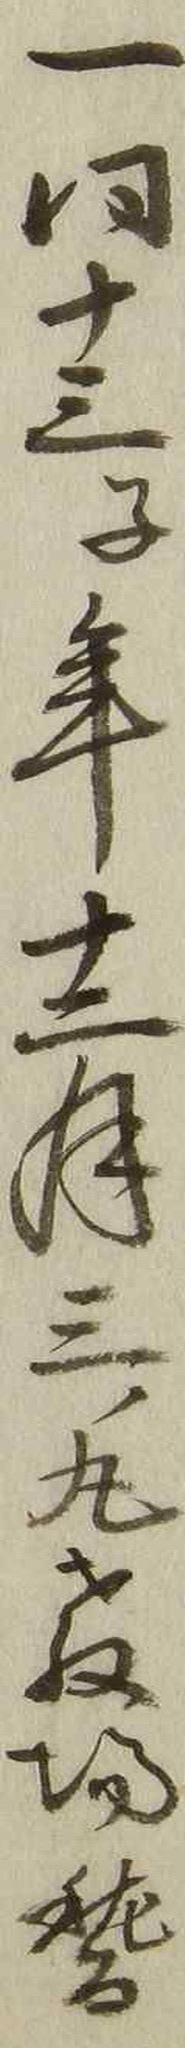一同十三子十二月三ノ丸教場稽
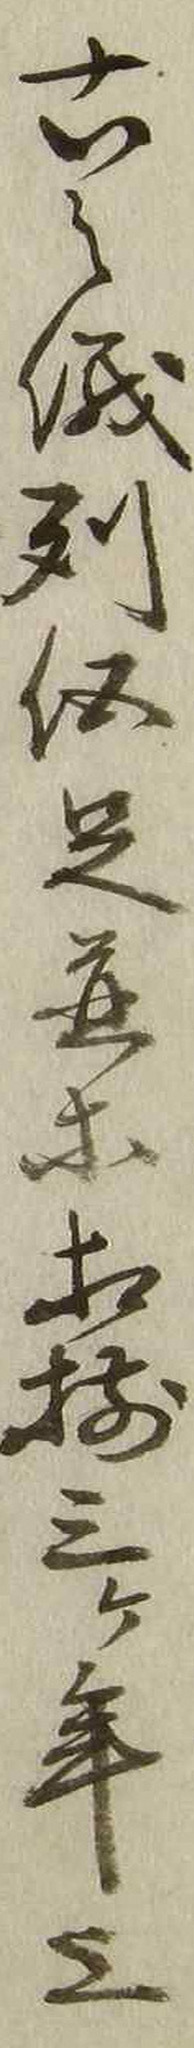古ノ儀列伍足並等相揃三ケ年上
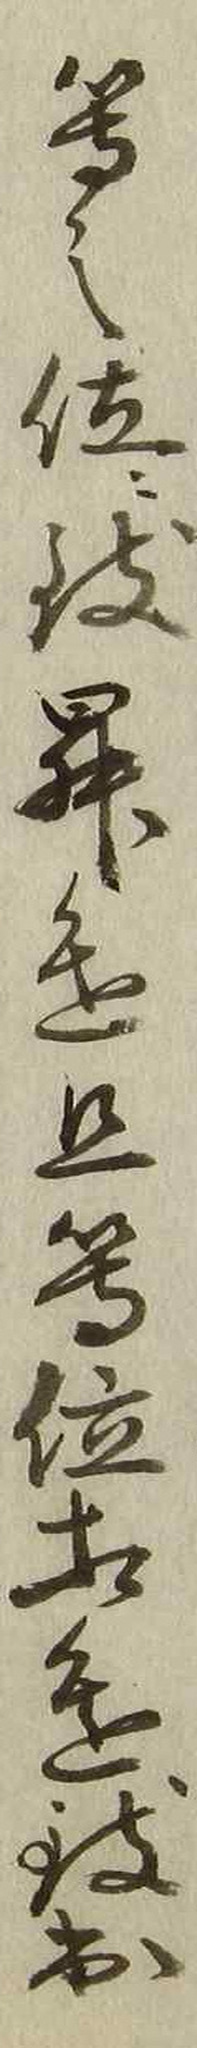等之位ニ致昇進且等位相進致出
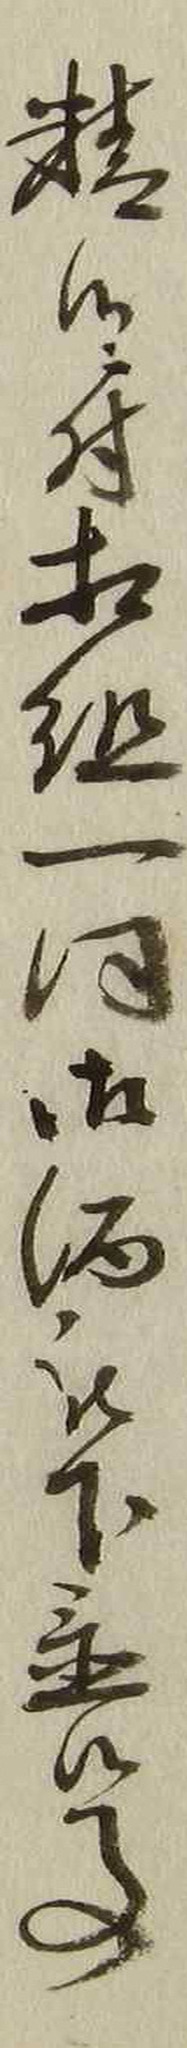精候ニ付相組一同御酒被下置候事
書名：諸士系譜　巻之31　い之部31
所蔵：会津若松市立会津図書館
